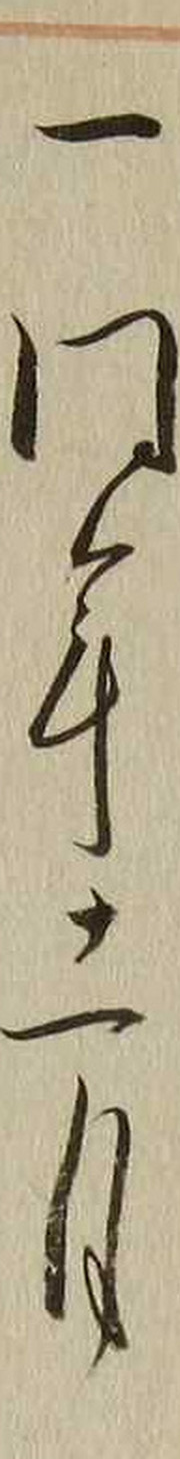一同年十一月
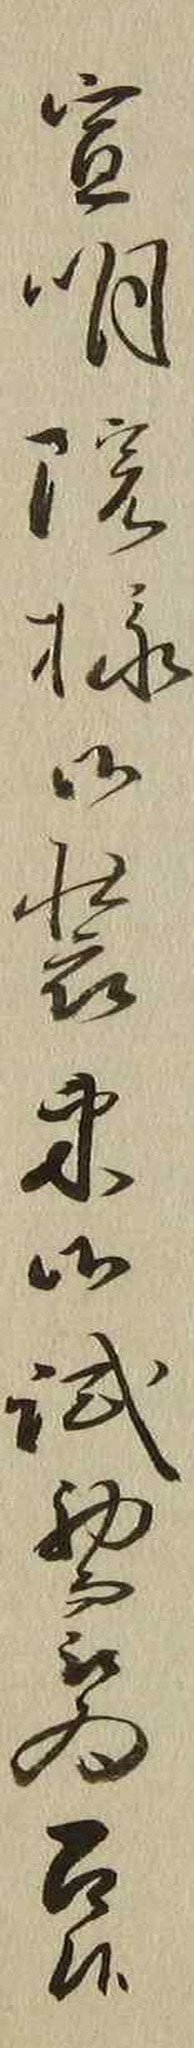宣明院様御装束御試初而被為召候
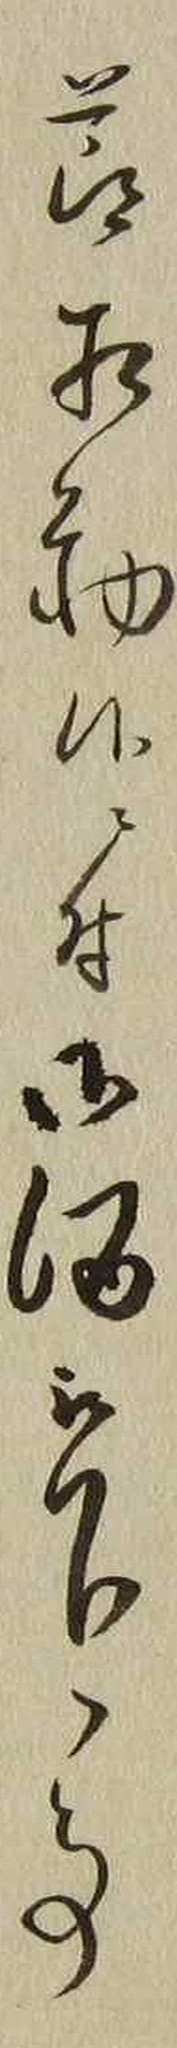節相勤候ニ付御酒被下候事
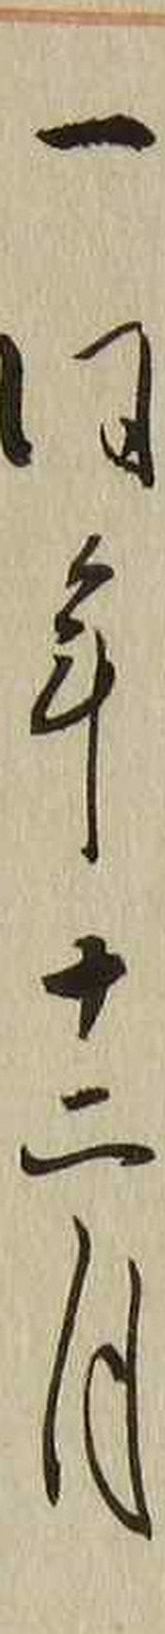一同年十二月
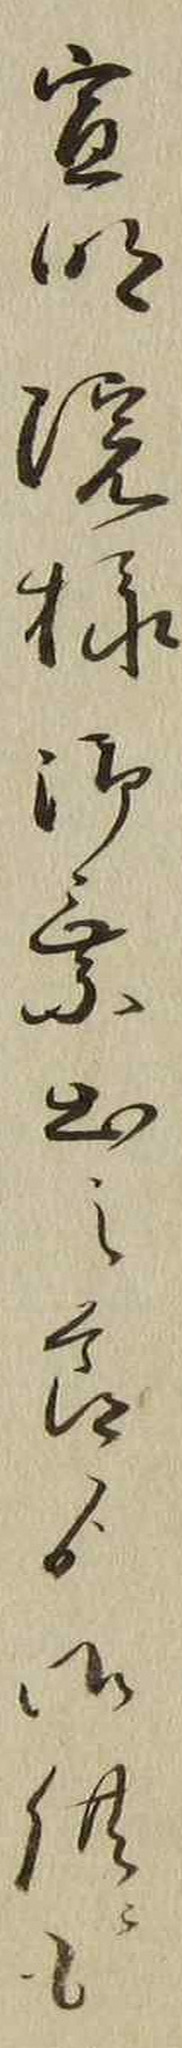宣明院様御乗出之節ゟ御供ニも
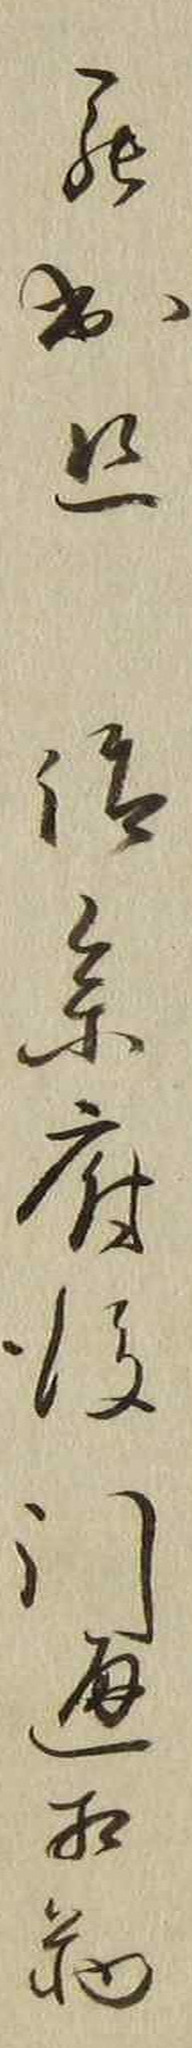罷出且御参府後引通相勤
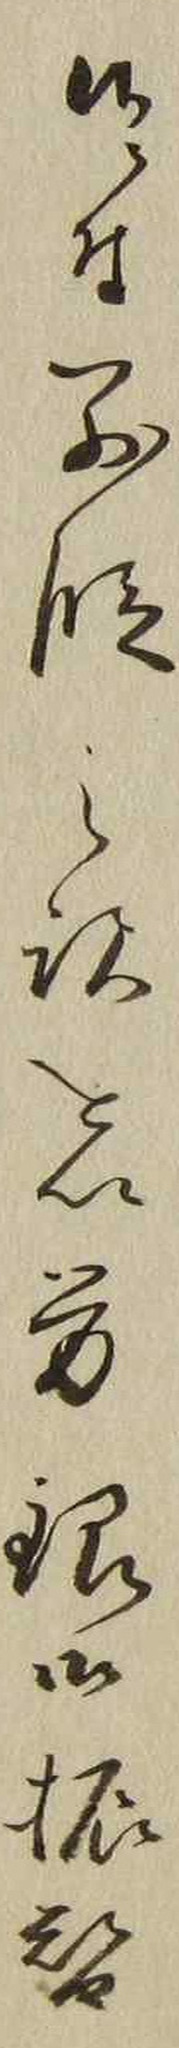候ニ付別段之訳を以労銀御振替
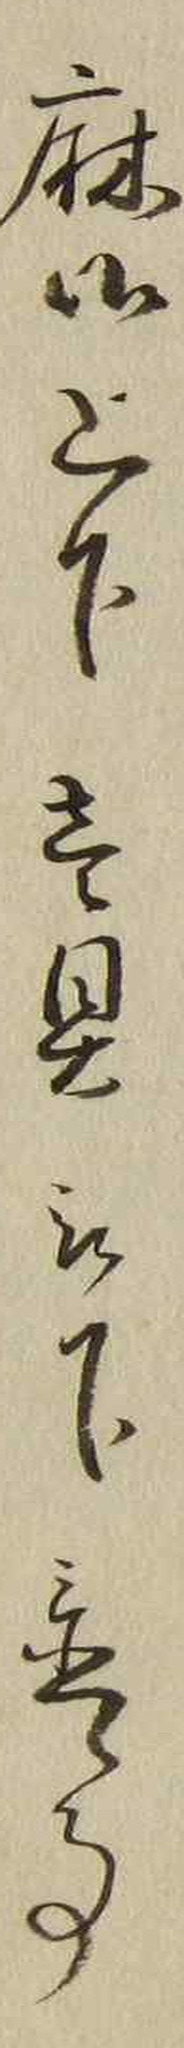麻御上下壱具被下置候事
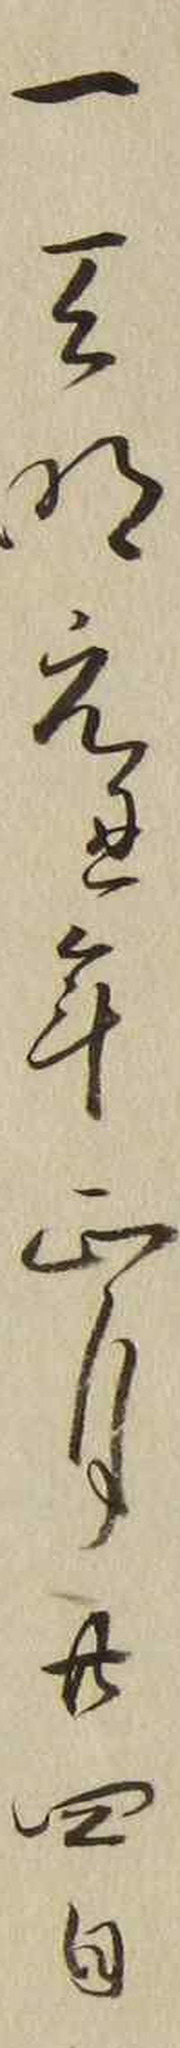一天明元丑年正月廿四日
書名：諸士系譜　巻之70　を之部4
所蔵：会津若松市立会津図書館
